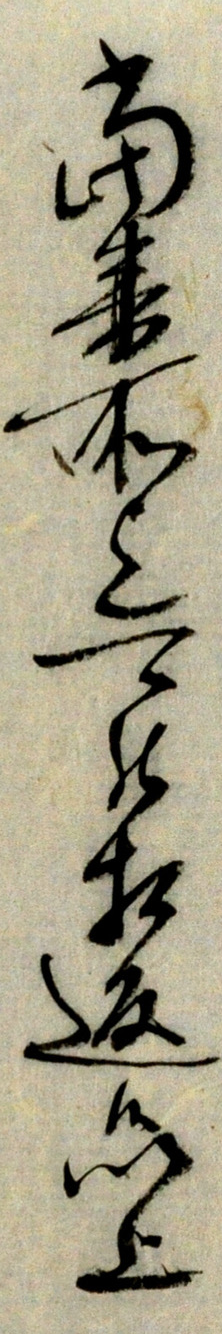当番所迄可被相返候以上

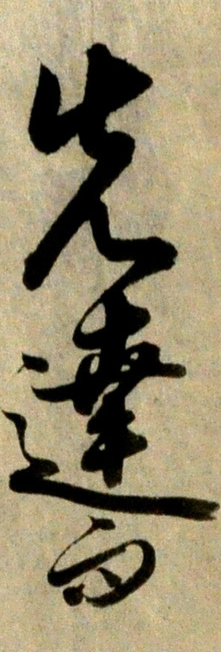先達て
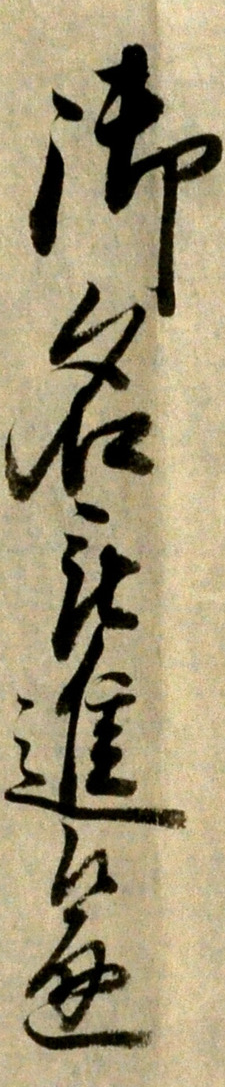御名被進候通
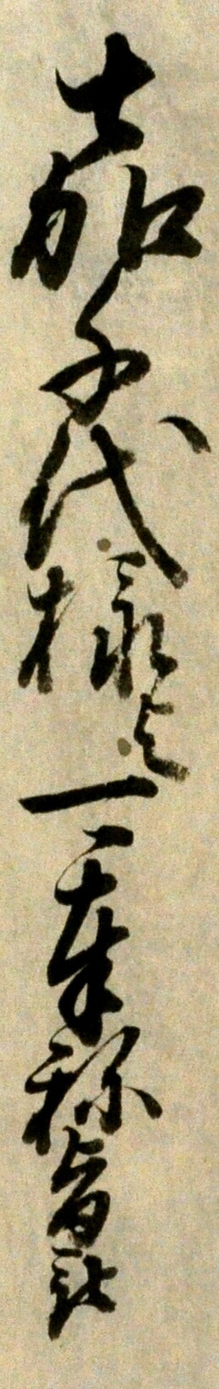嘉千代様と可奉称旨被
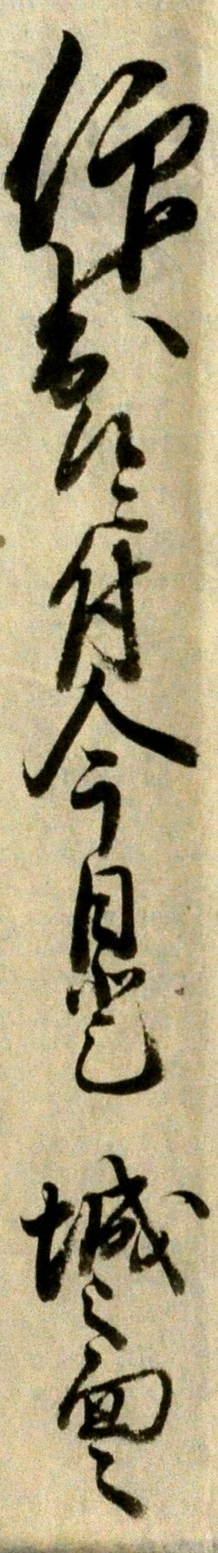仰出候に付今日登城之面々
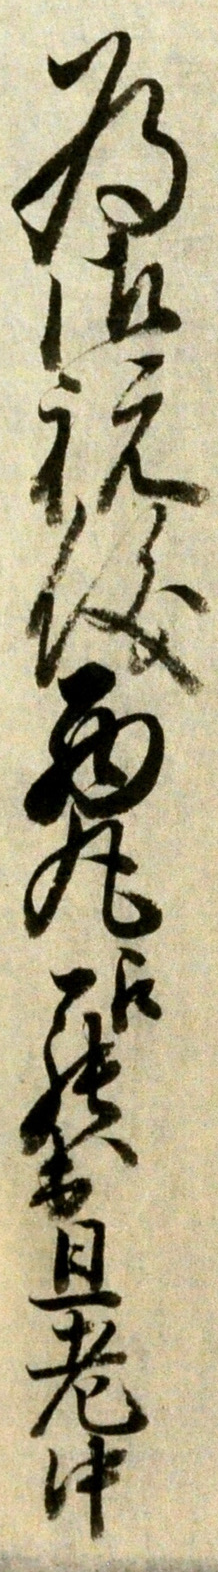為御祝儀西丸え罷出且老中
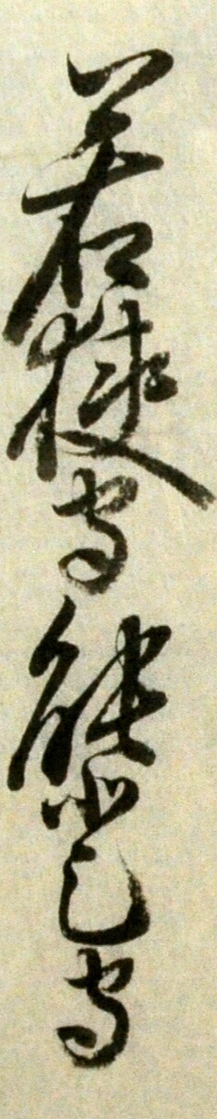若狭守能登守

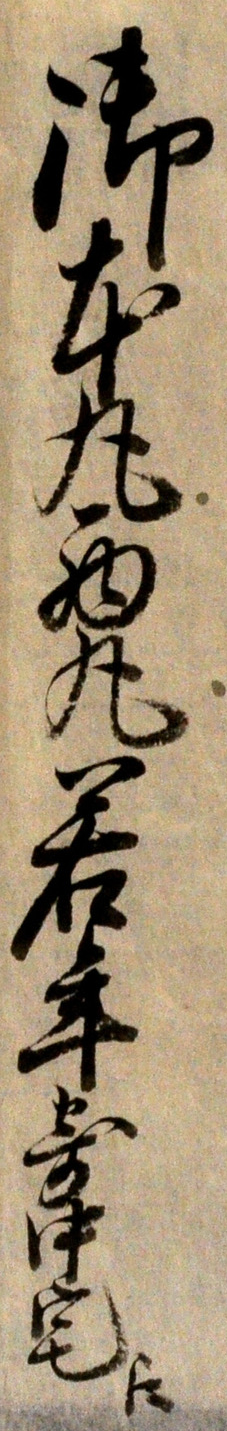御本丸西丸若年寄中宅え
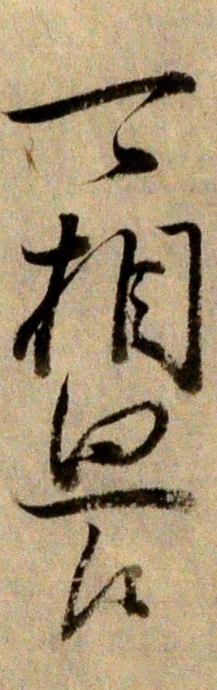可相廻候
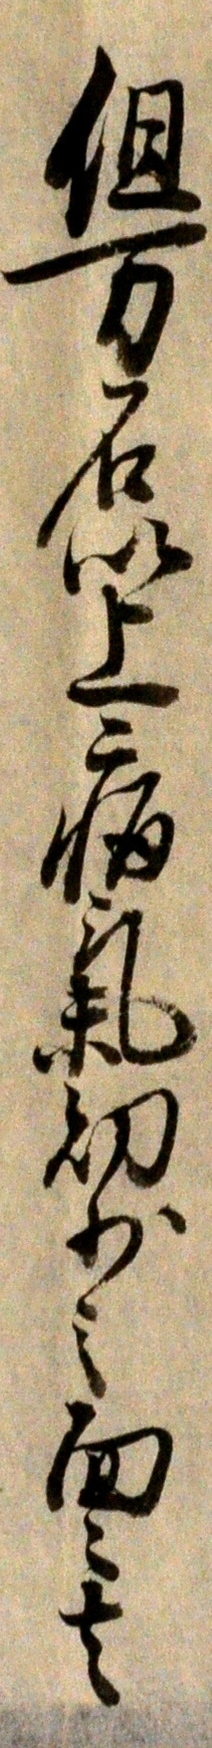但万石以上病気幼少之面々は
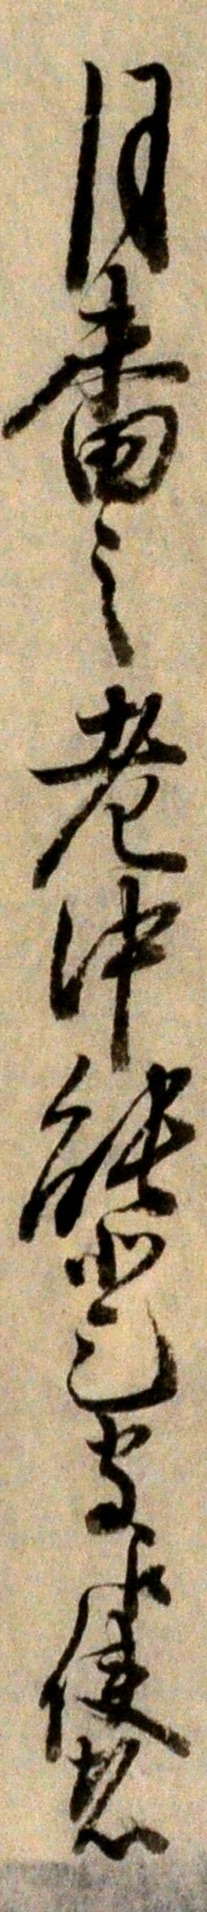月番之老中能登守え使者
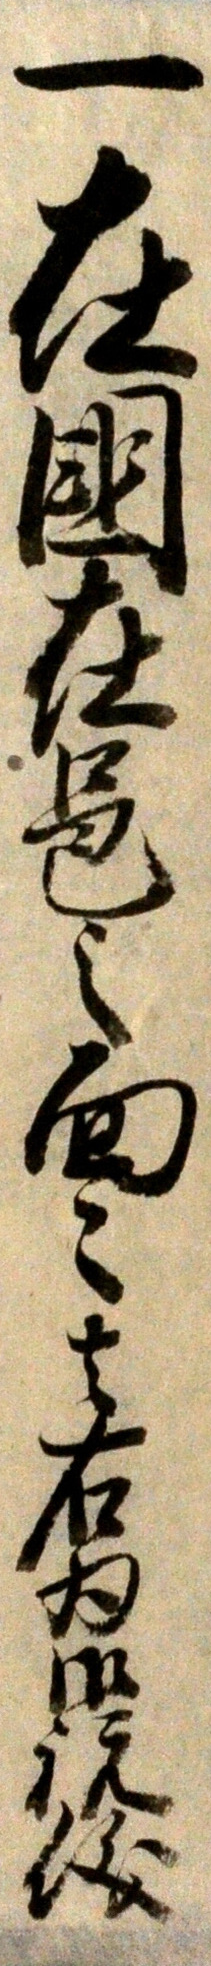一在国在邑之面々は右為御祝儀
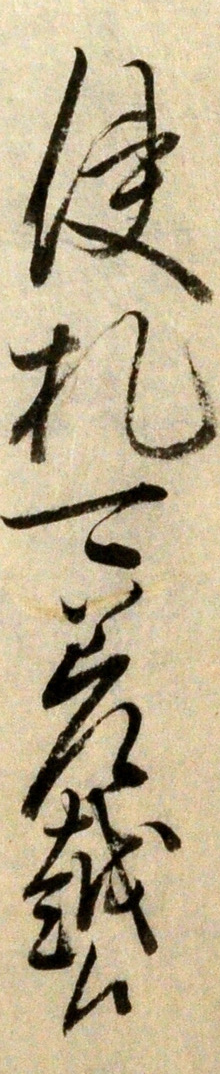使札可差越候

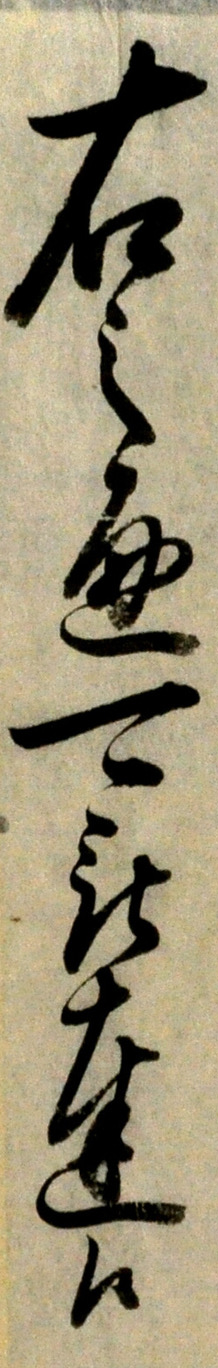右之通可被達候
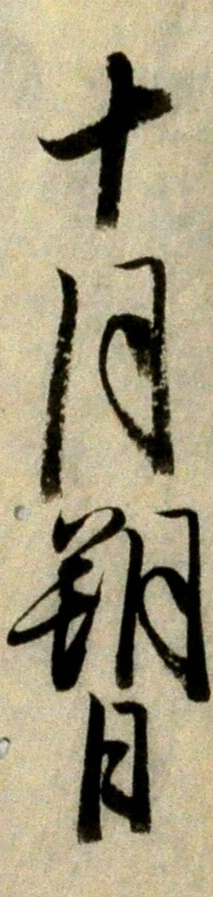十月朔日

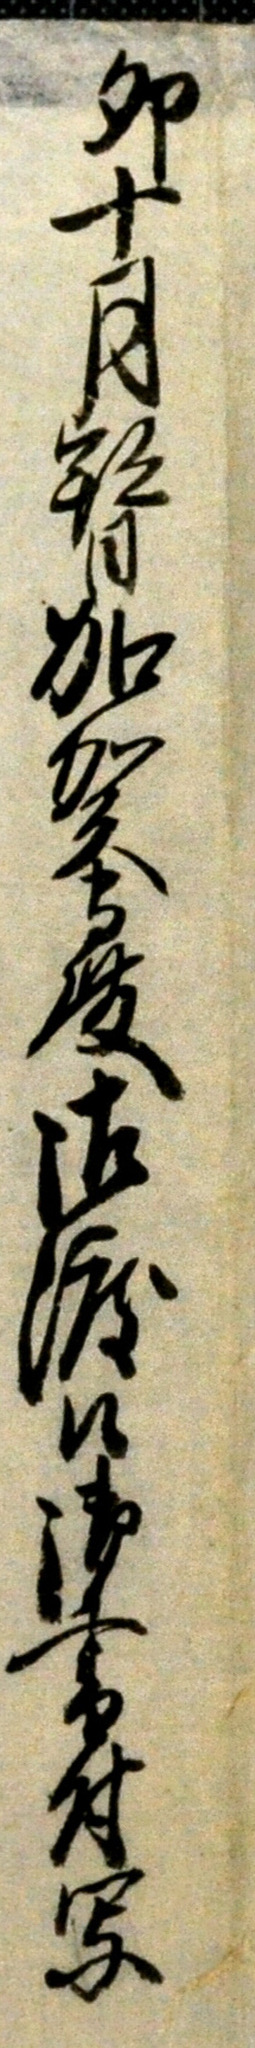卯十月朔日加賀守殿御渡候御書付写
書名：申合帳〔一括〕
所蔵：伊那市立高遠町図書館・合同会社AMANE
